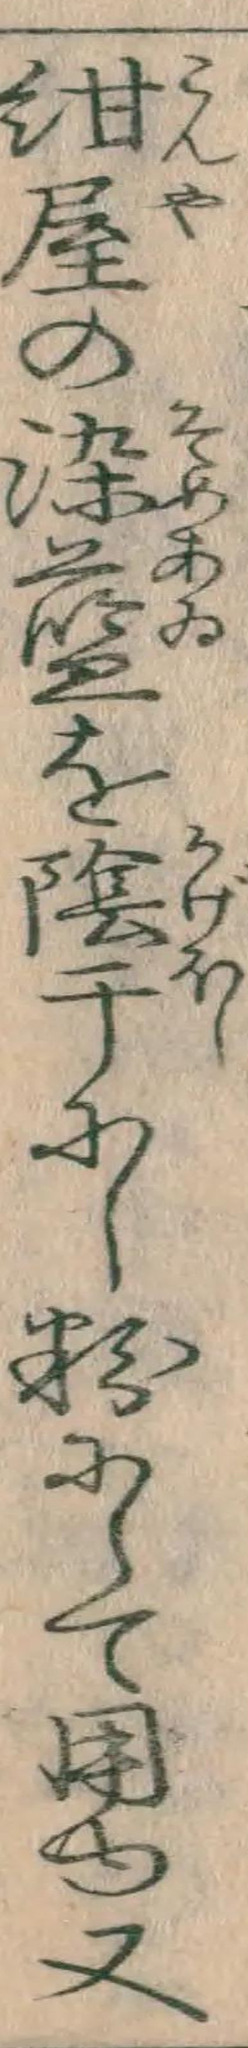紺屋の染藍を陰干にし粉にして用ゆ又
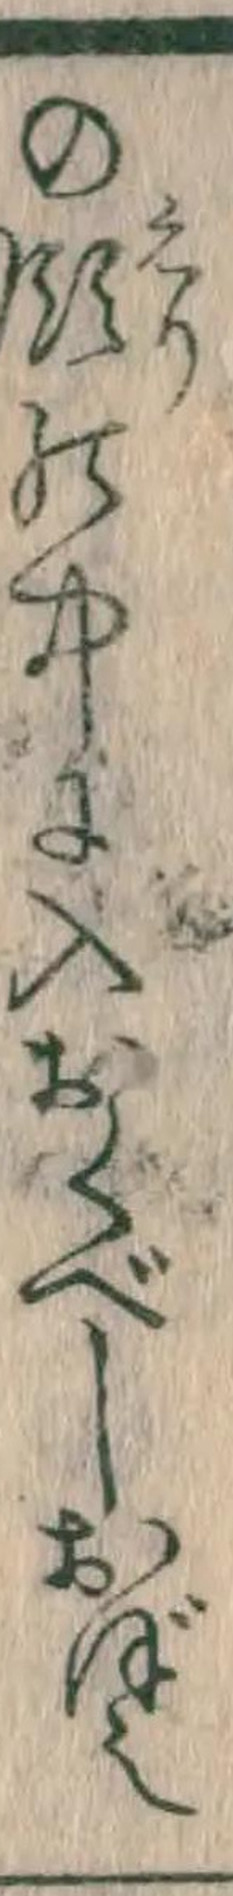の領の中に入おくべしおぼえ
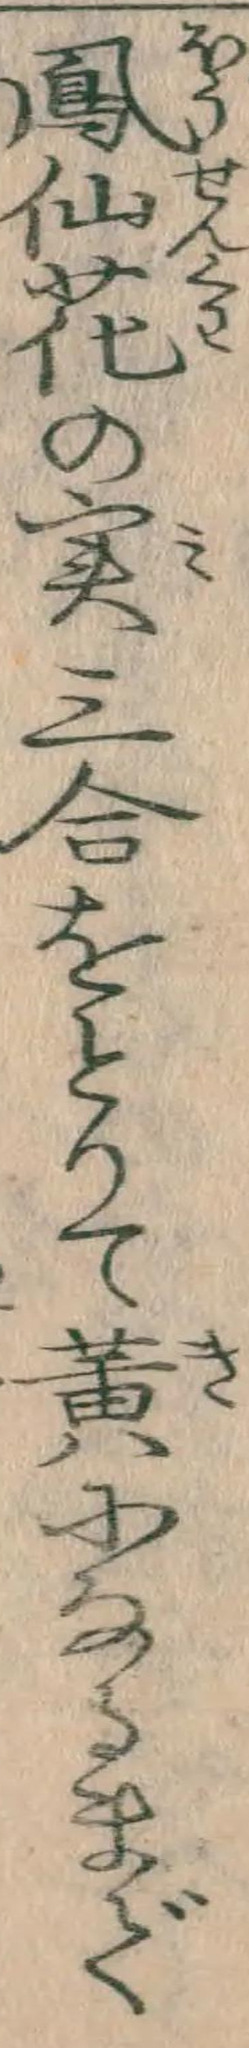鳳仙花の実三合をとりて黄になるまで
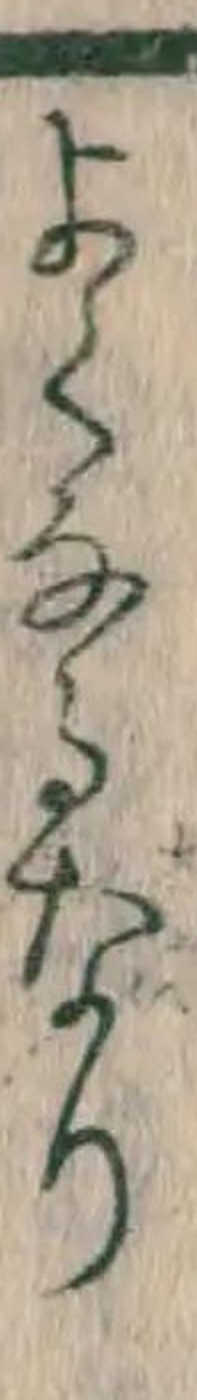よくなるなり
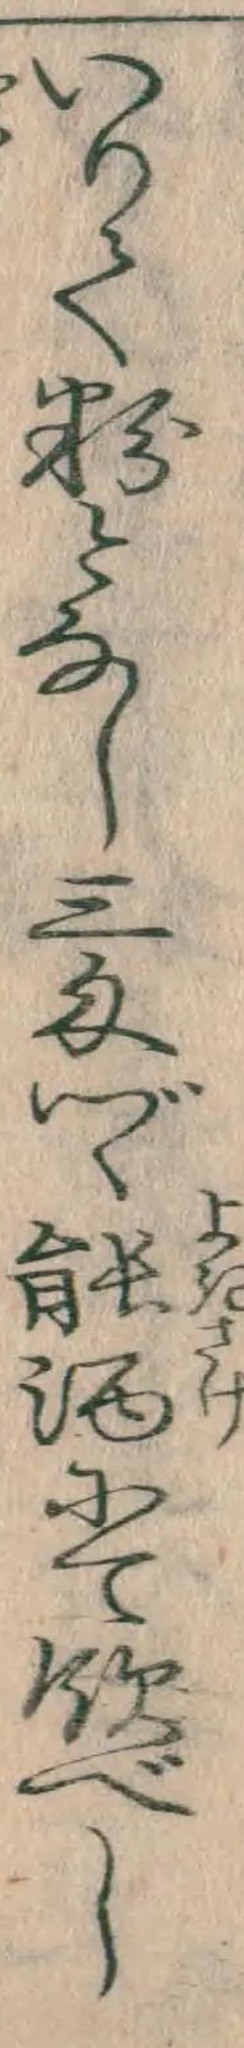いりて粉となし三匁づゝ能酒にて飲べし
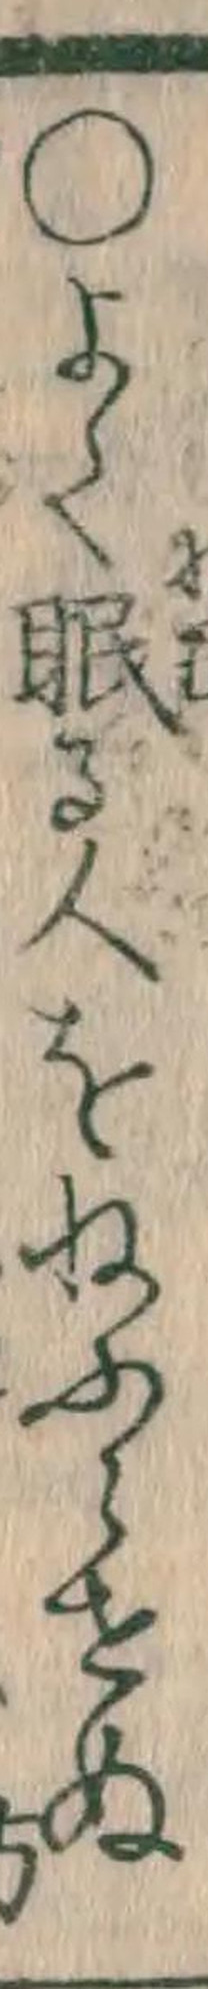○よく眠る人をねふらせぬ方
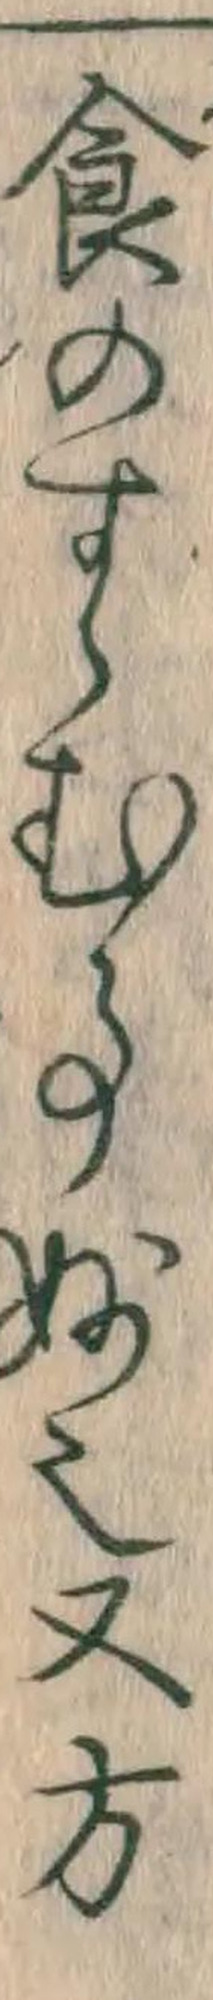食のすゝむ事妙也又方
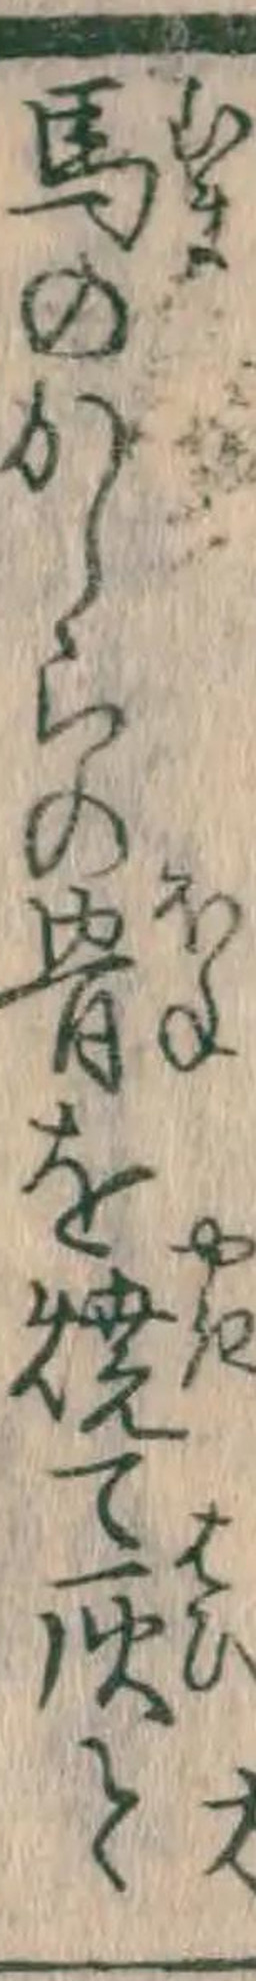馬のかしらの骨を焼て灰と
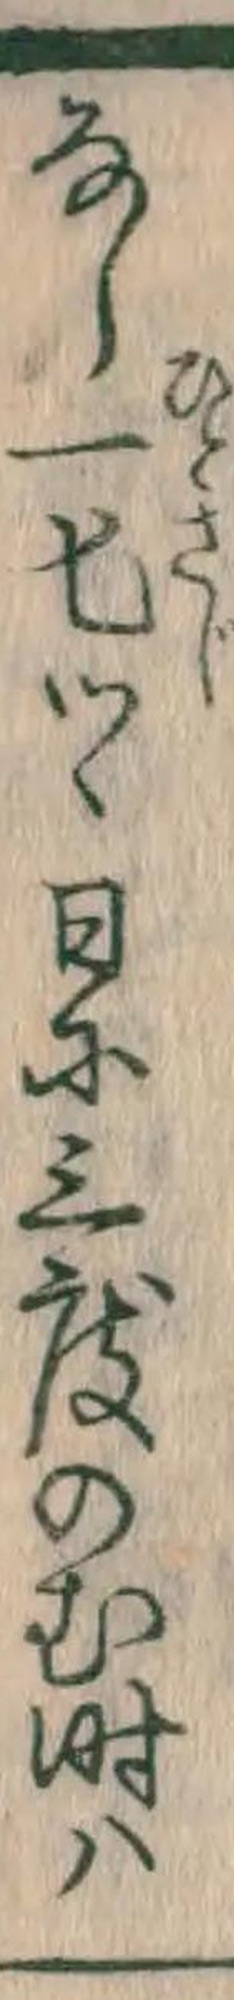なし一匕つゝ日に三度のむ時は
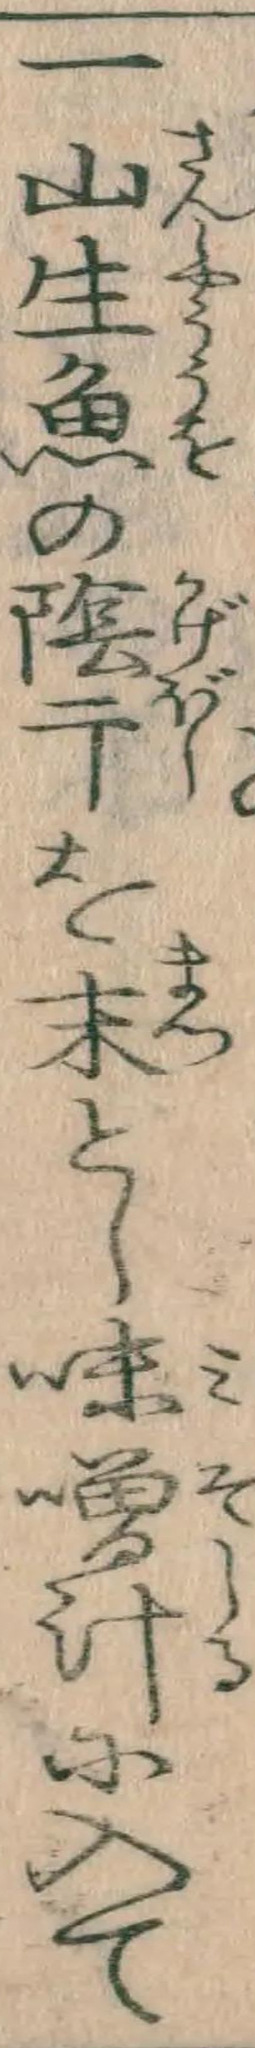一山生魚の陰干を末とし味噌汁に入て
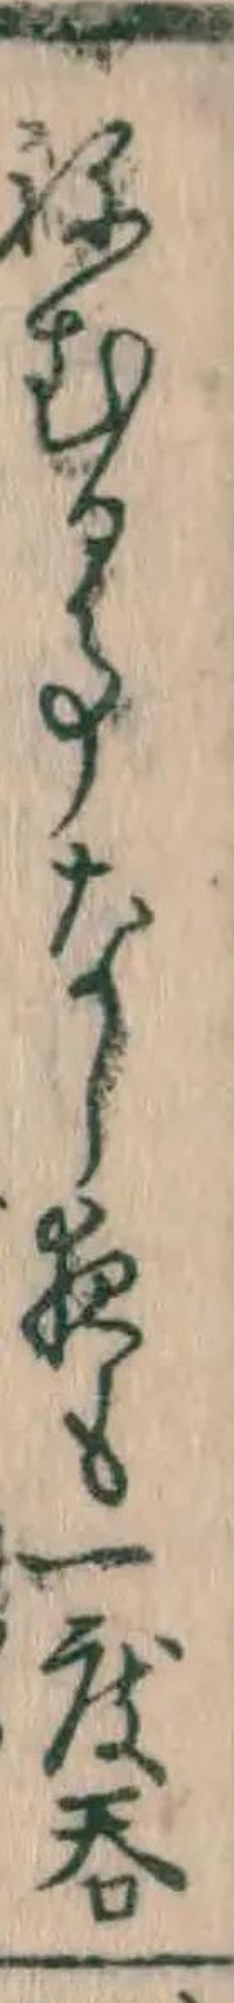ねむる事なし夜も一度吞
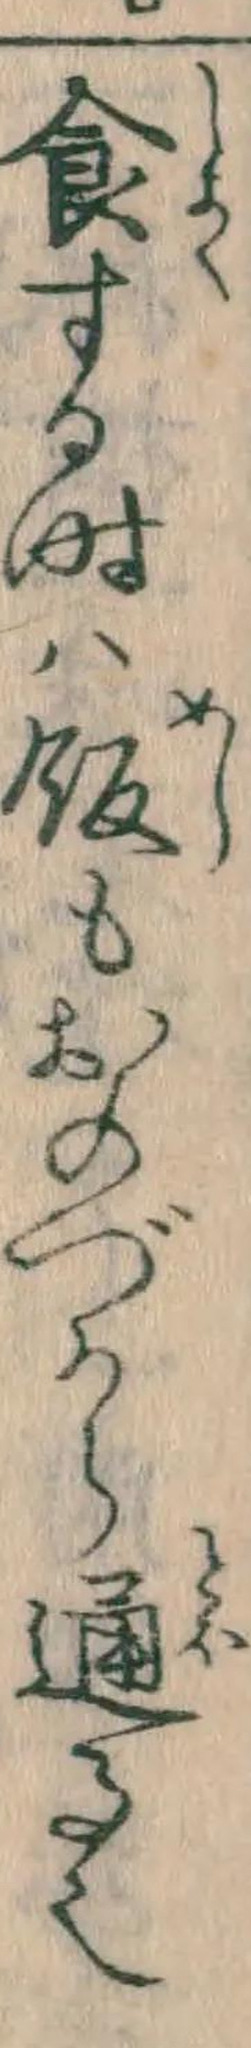食する時は飯もおのづから通る也
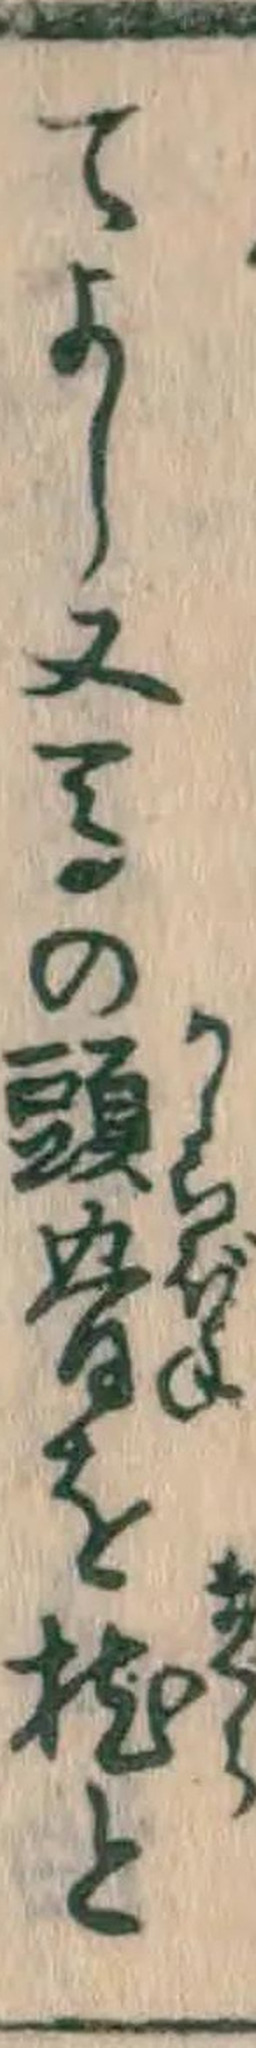てよし又馬の頭骨を枕と
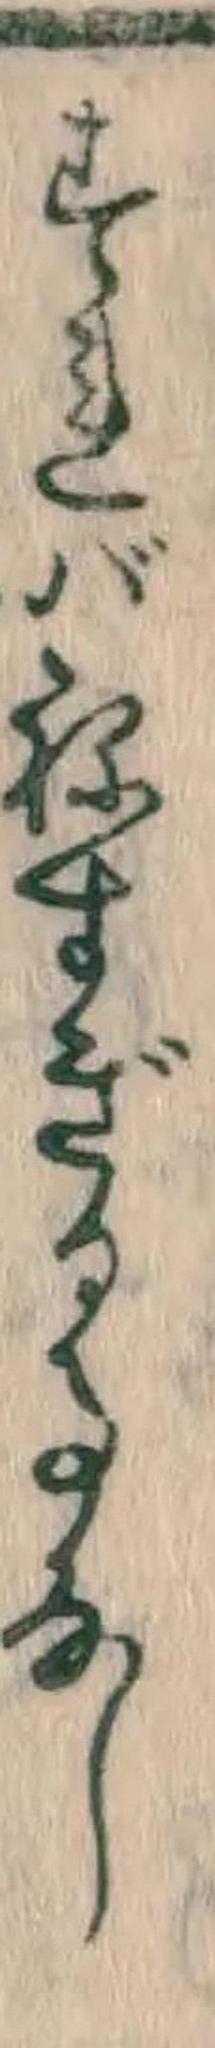すればねすぎる事なし
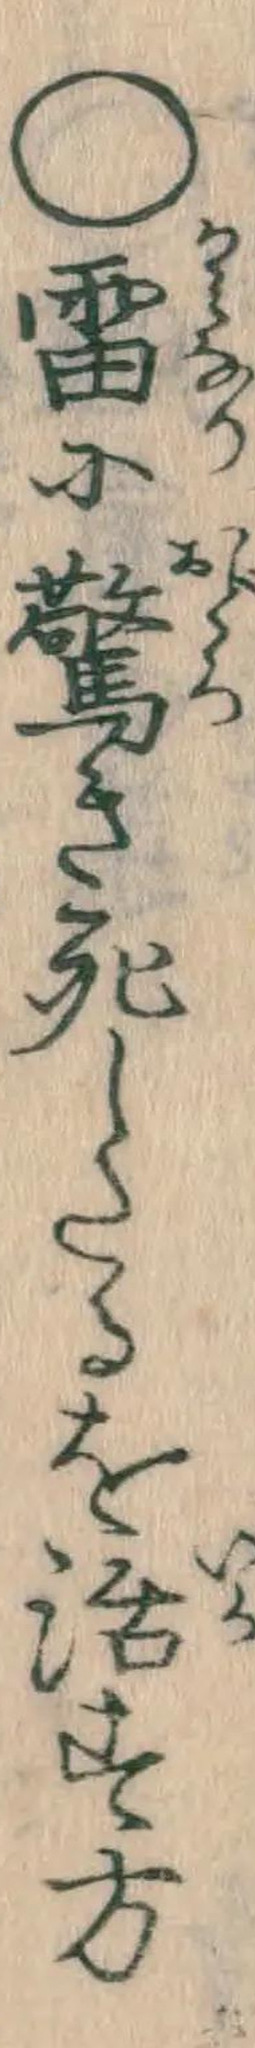○雷に驚き死したるを活す方
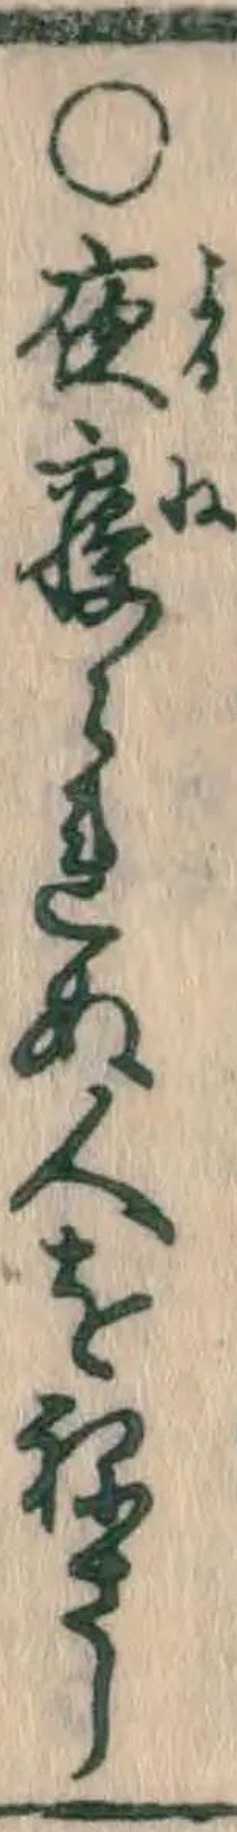○夜寝られる人をねさし
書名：広益秘事大全 3巻. [4]
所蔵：国立国会図書館 National Diet Library, JAPAN
